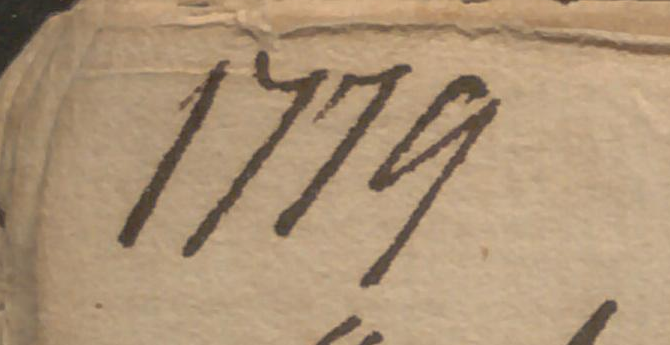1779
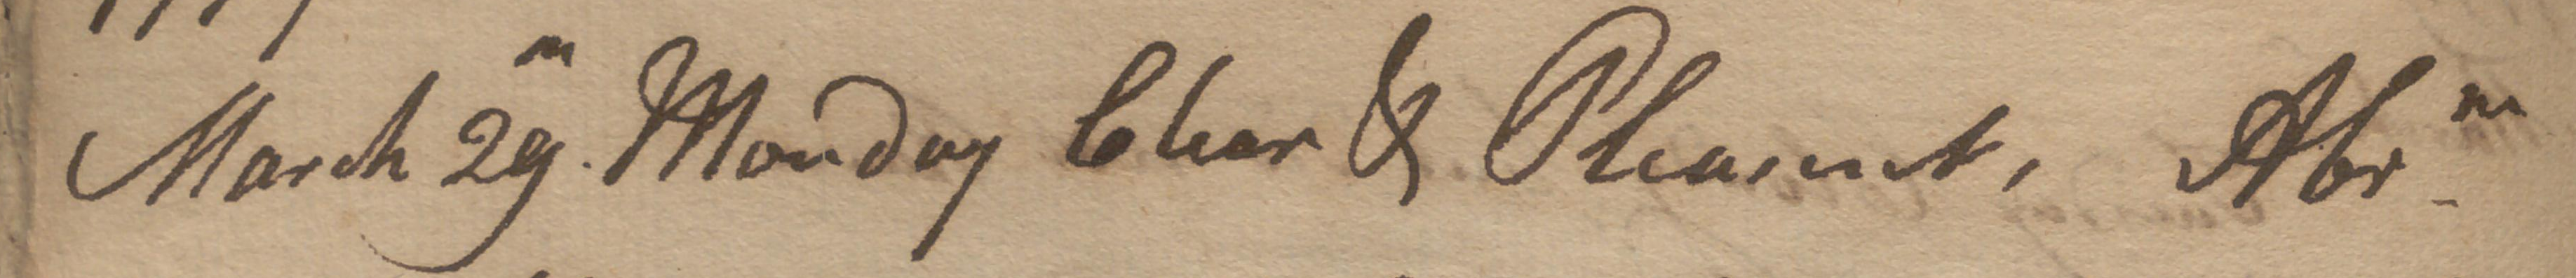March 29^th. Monday Clear & Pleasent. Abr^m.
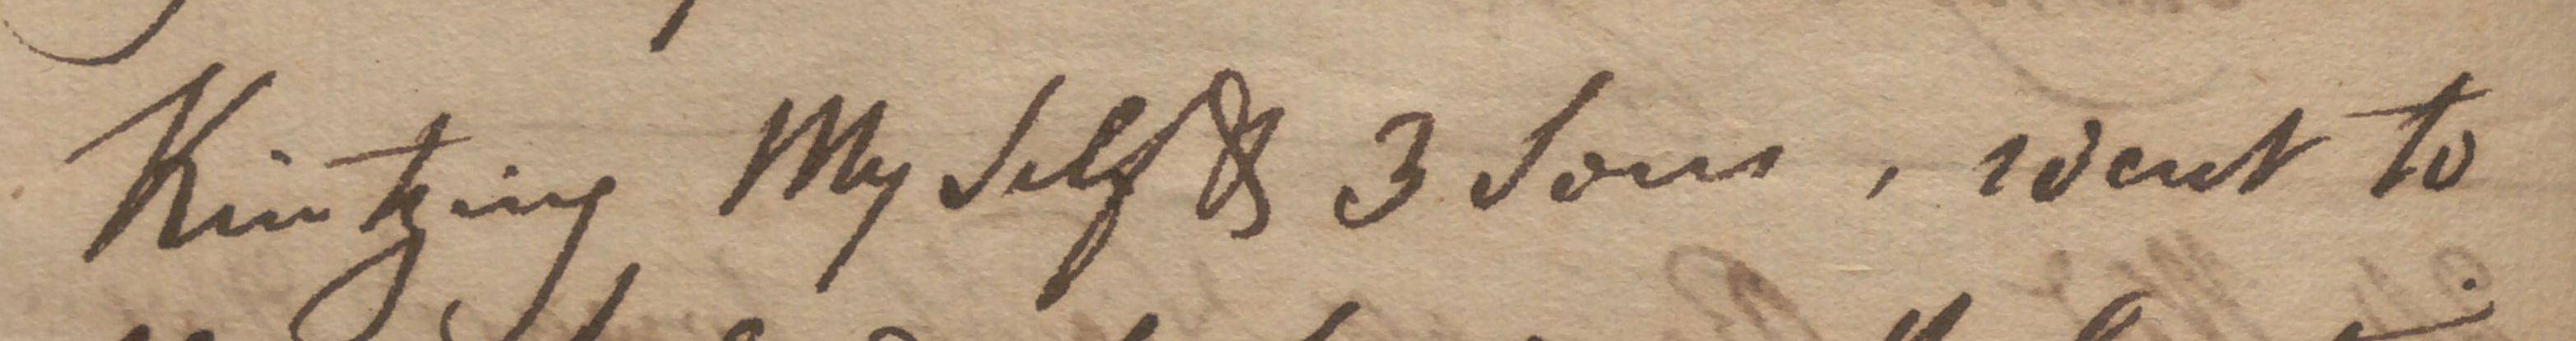Kintzing My Self & 3 Sons, went to
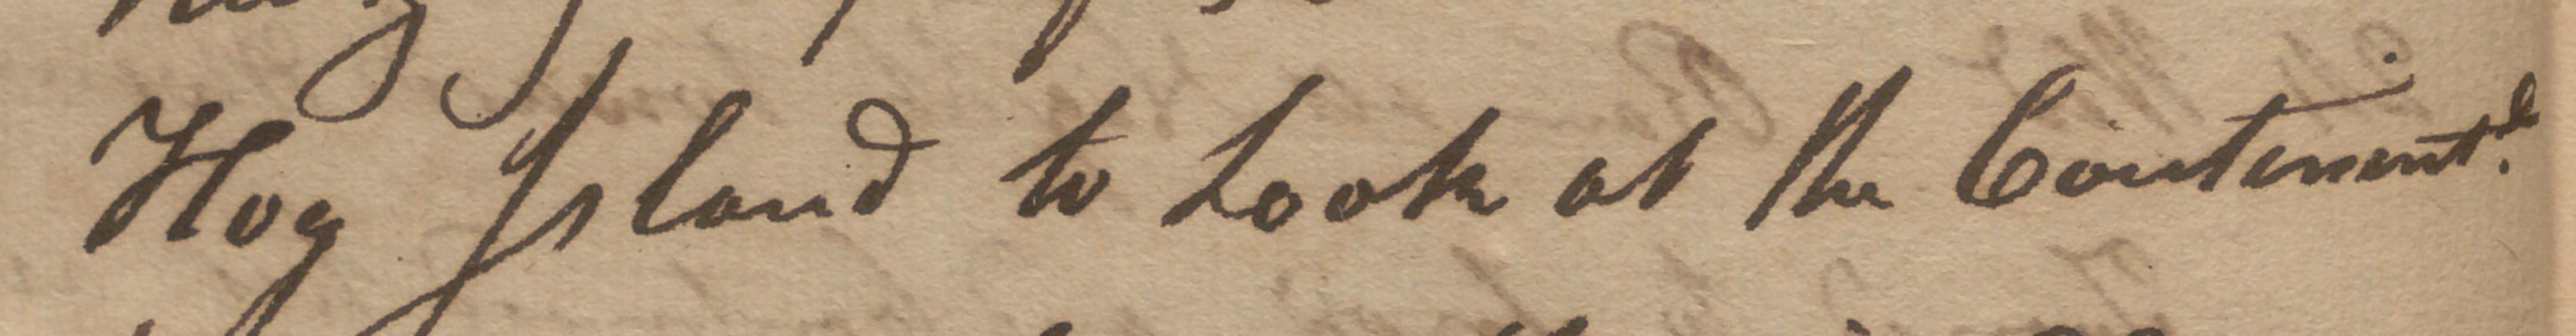Hog Island to Look at the Continent^l.
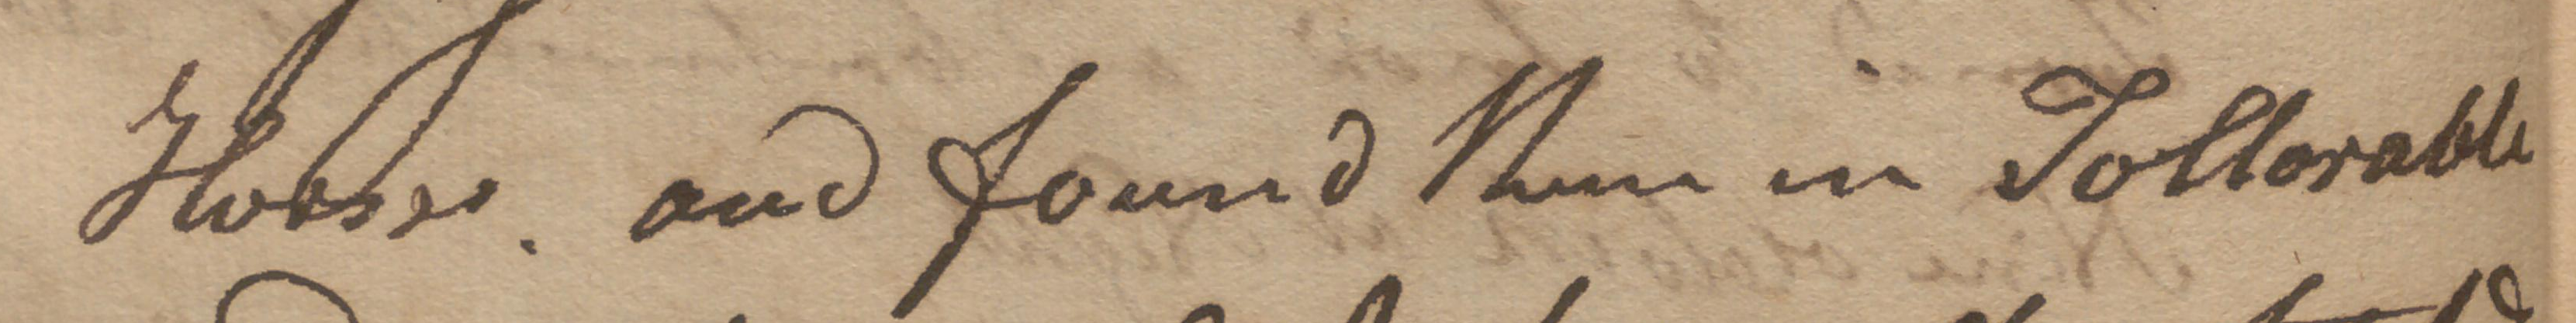Horses and found them in Tollerable
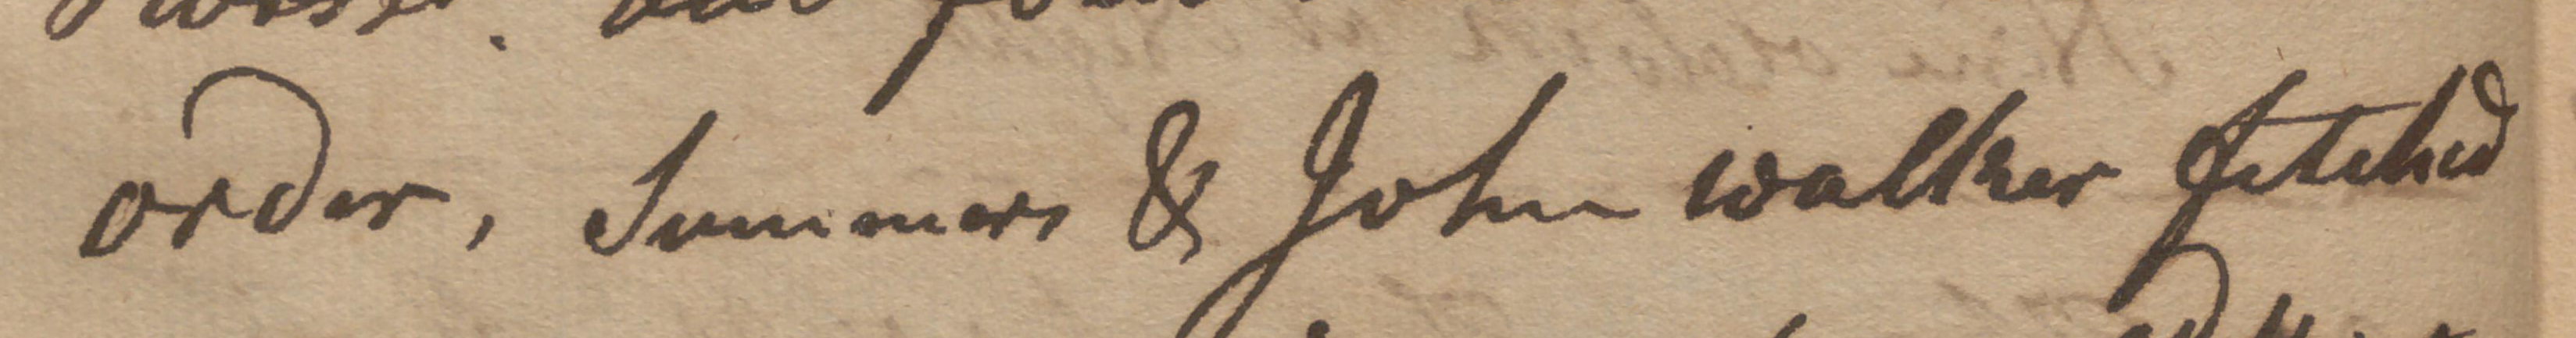order, Summers & John walker fetched
